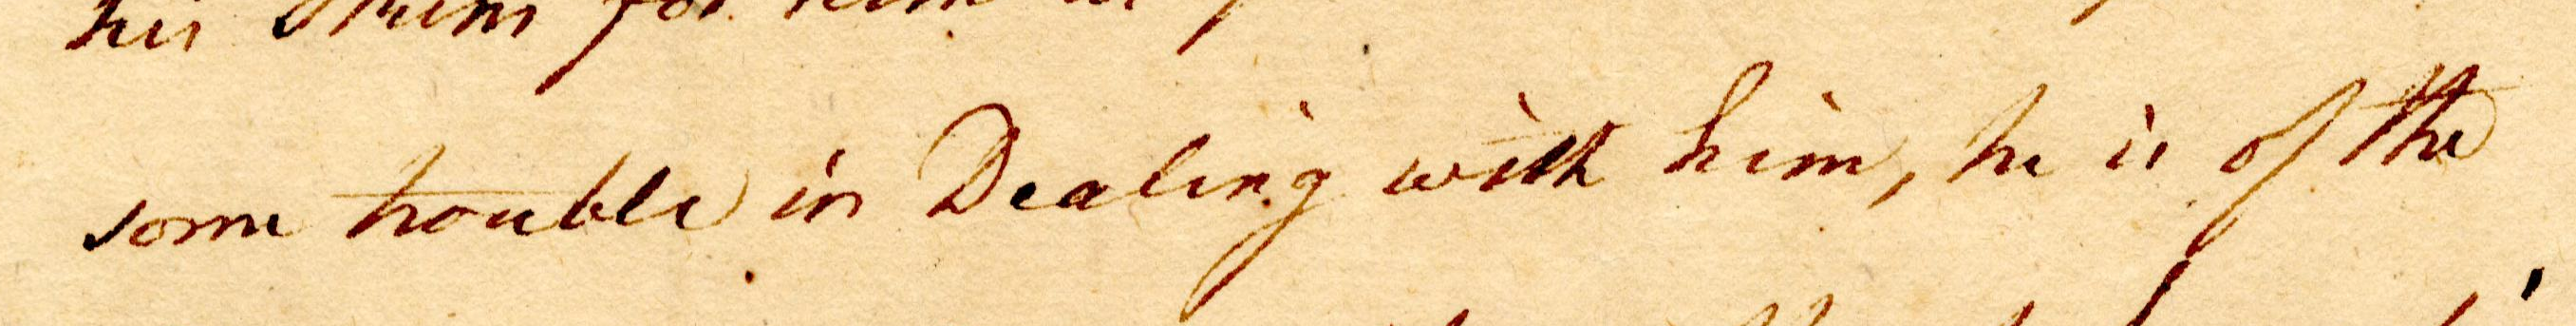some trouble in Dealing with him, he is of the
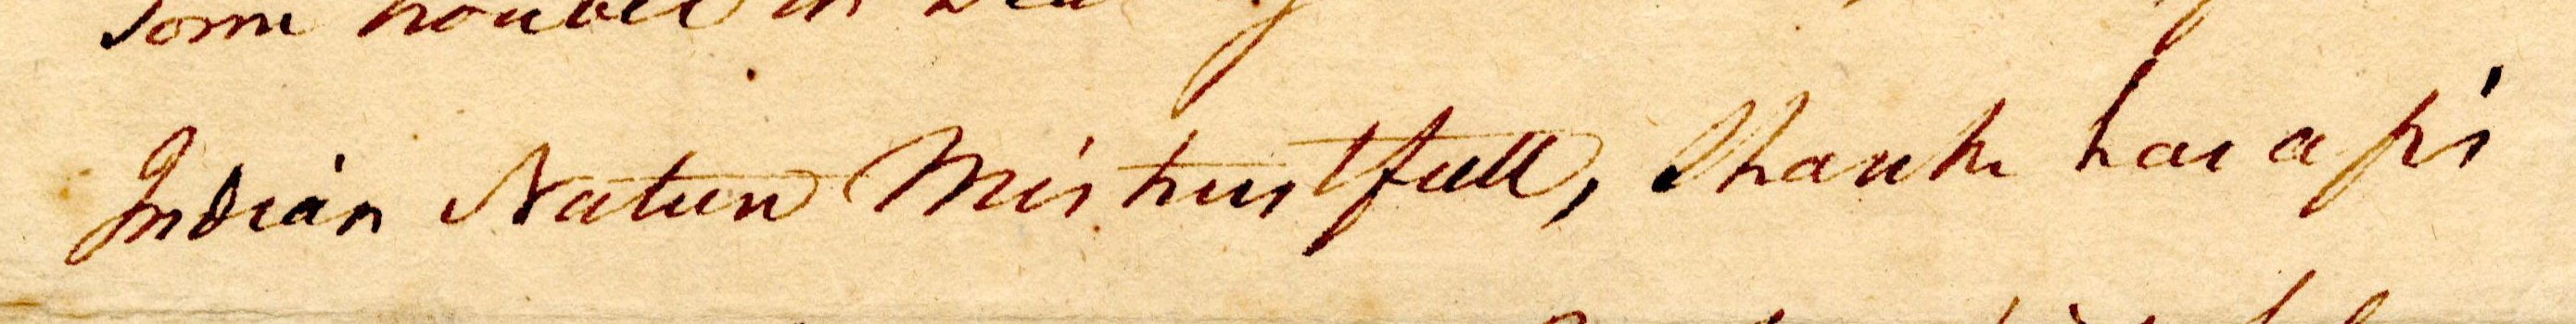Indian Nation Mistrustfull, Shank has a pr
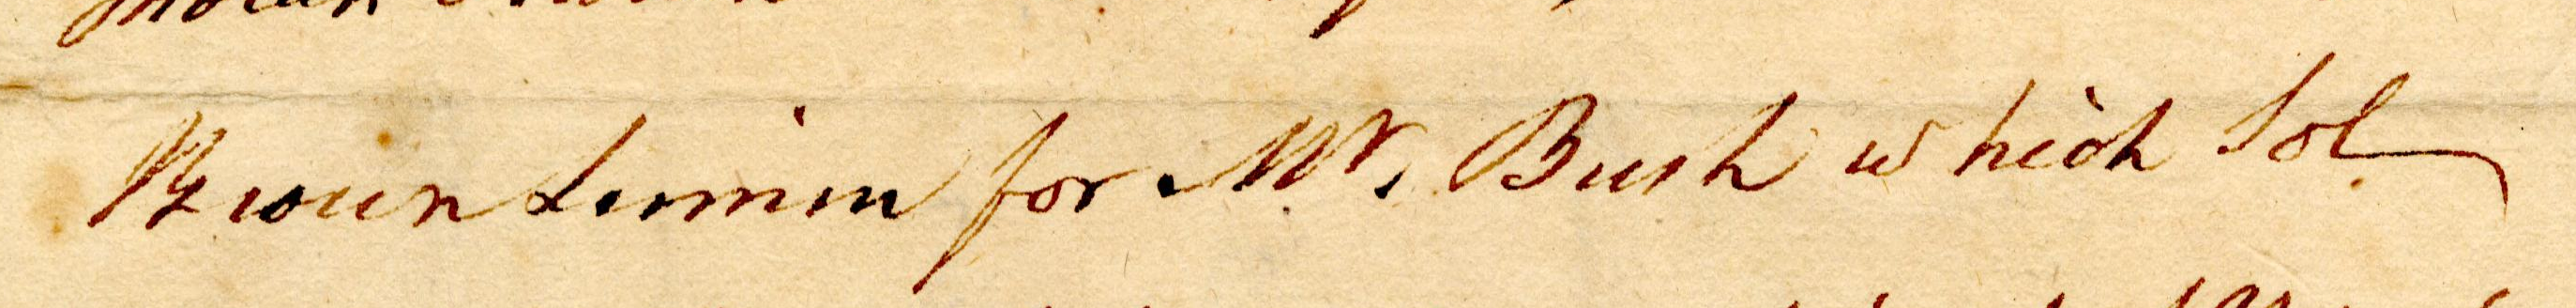Brown Linen for M^r. Bush which Sol
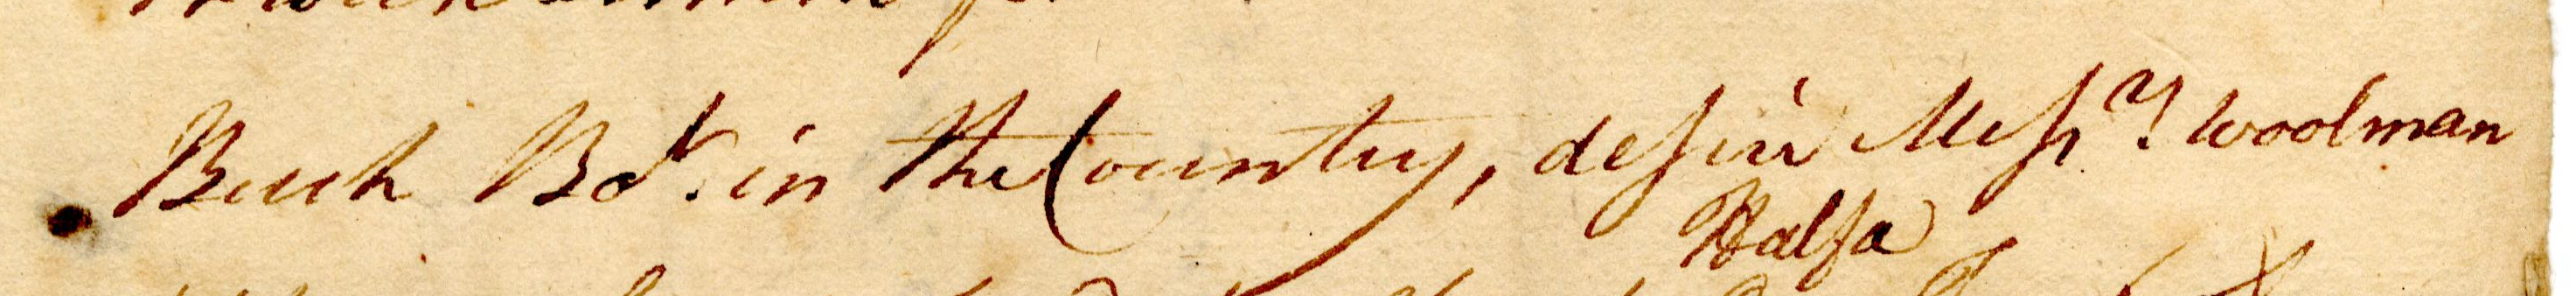Bush Bo^t. in the County, desire Mess^rs. Woolman
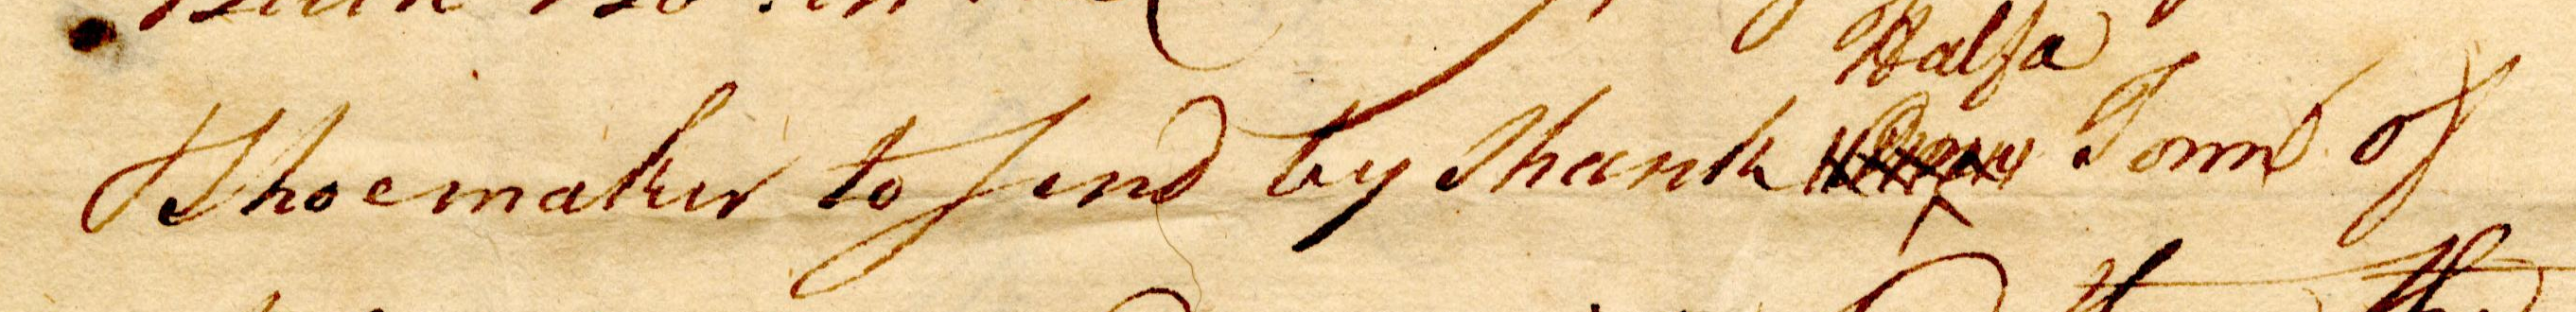& Shoemaker to find by Shank [____] Tonn of
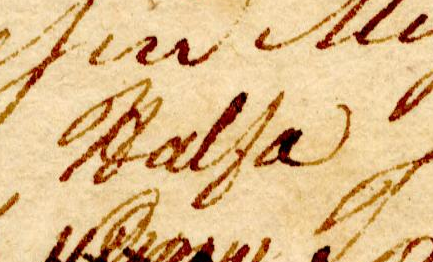Half a
